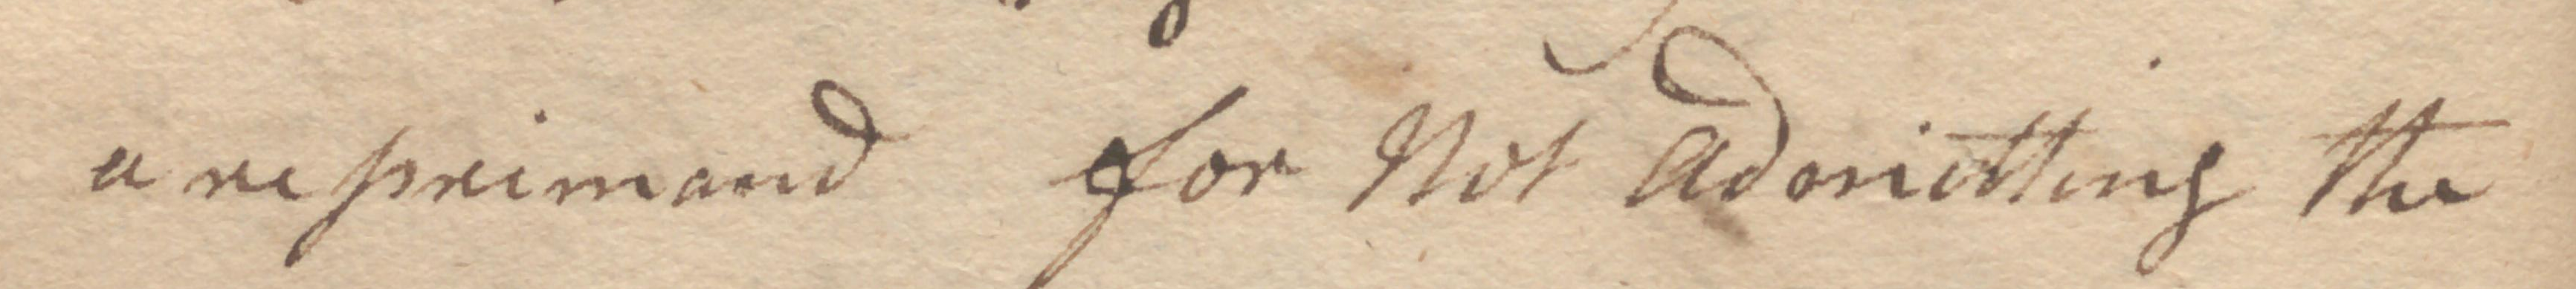a reprimand for Not Admitting the
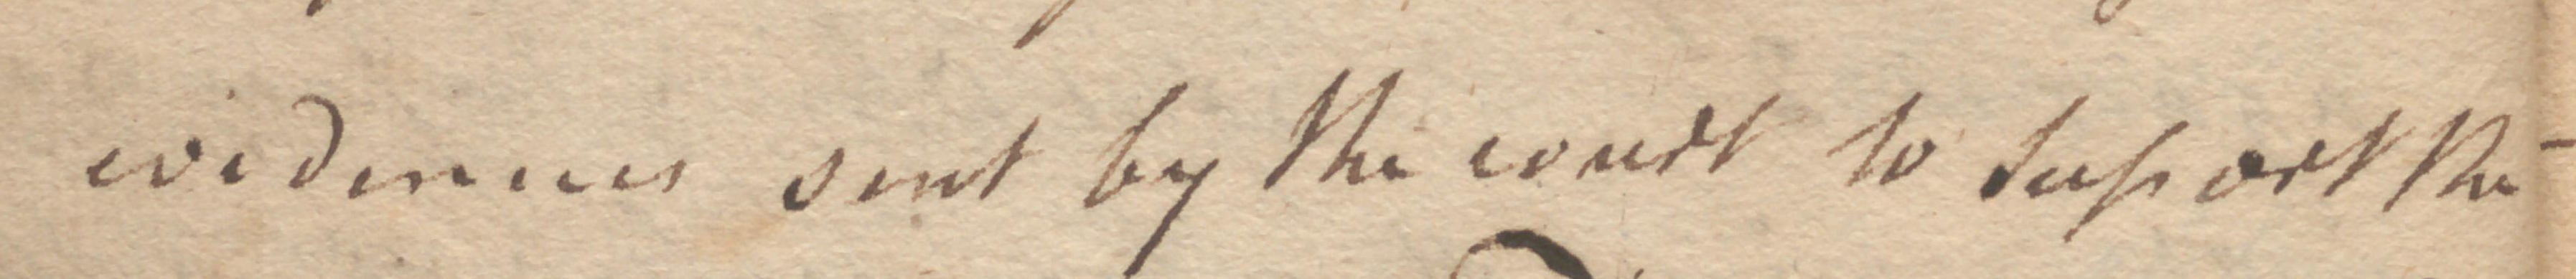evidences sent by the court to suport the
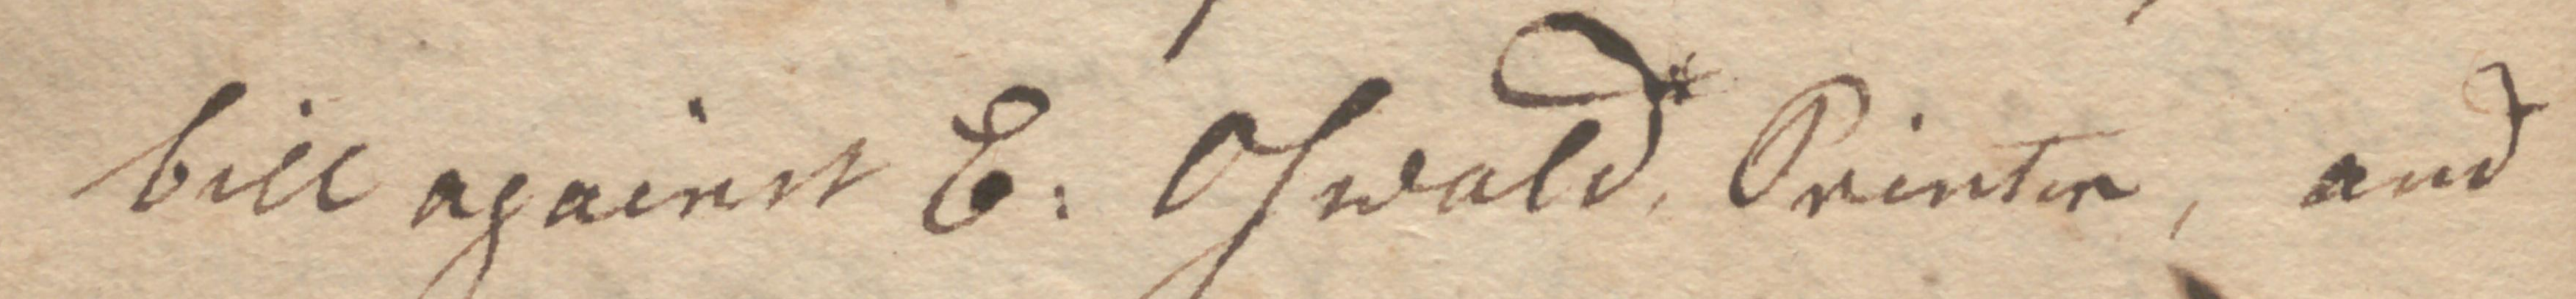bill against E: Ofwald Printer, and
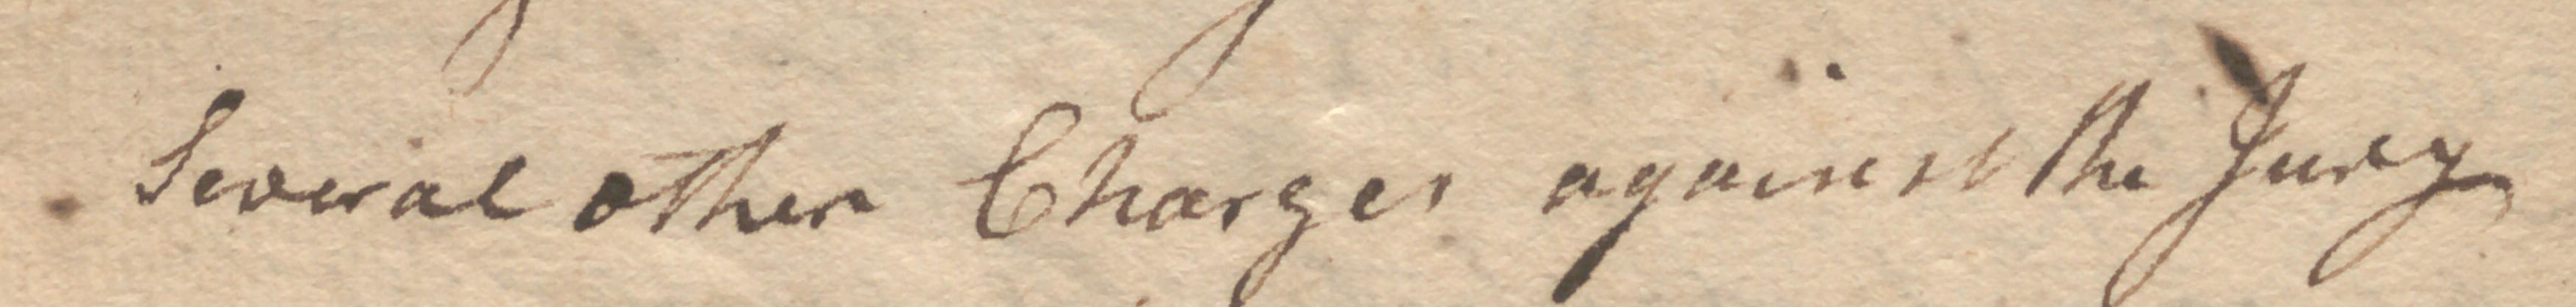Several other Charges against the Juny
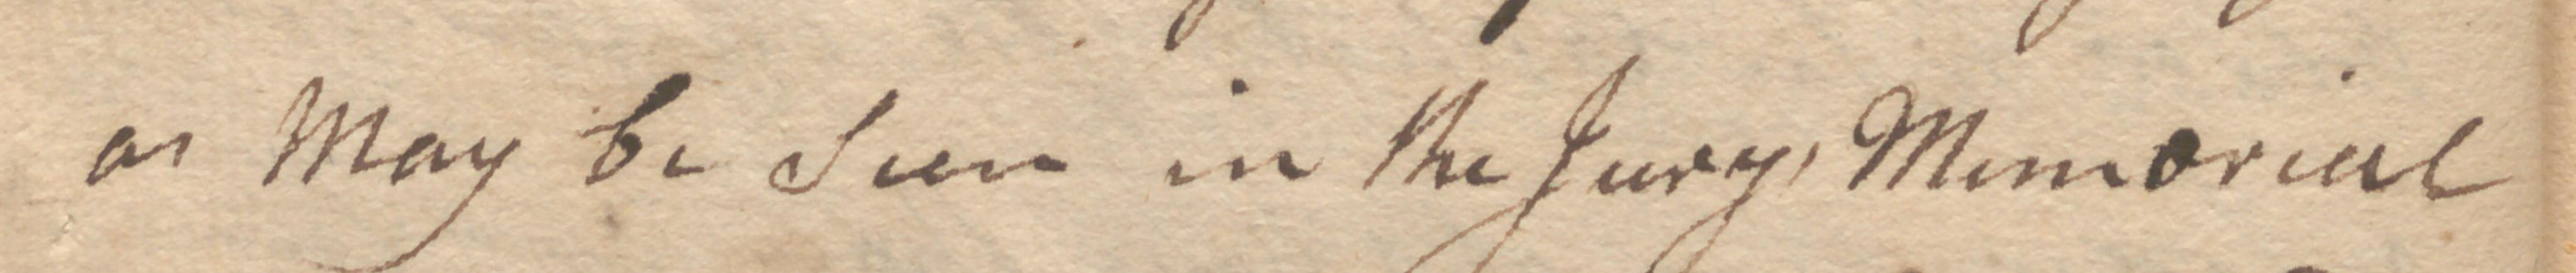as May be seen in the Jurys Memorial
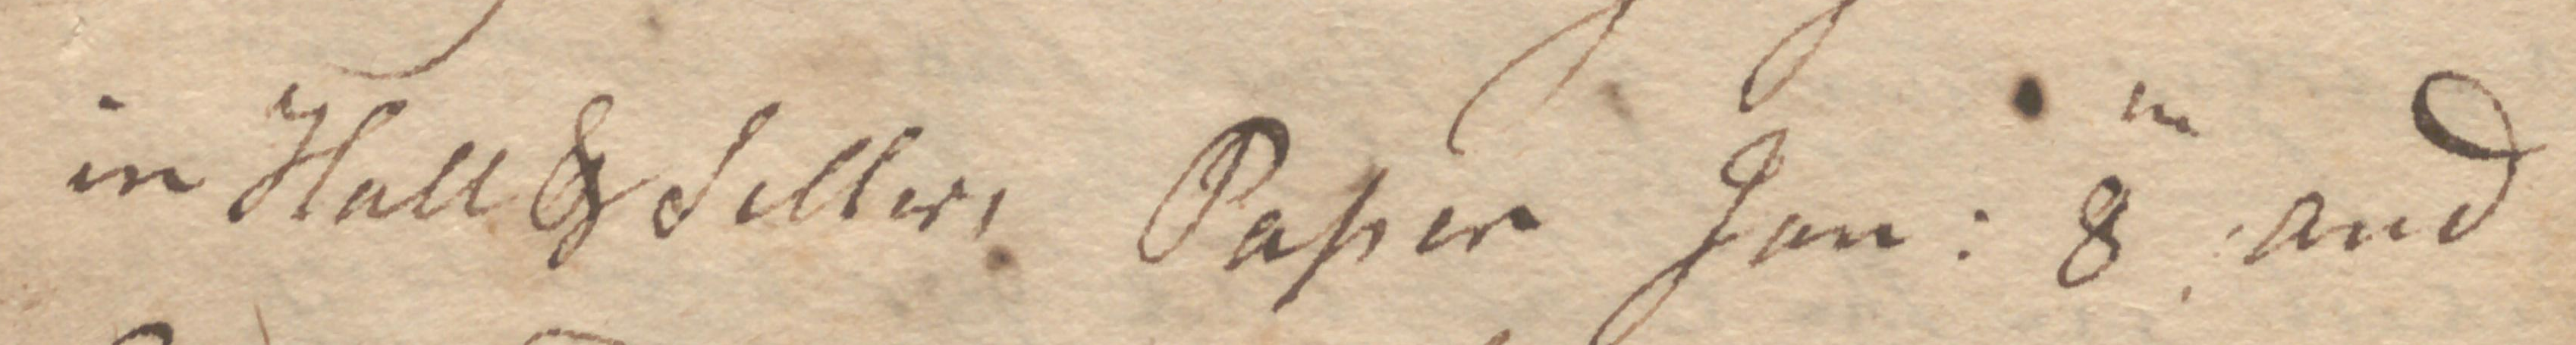in Hall & Sellers Paper Jan: 8^th and
